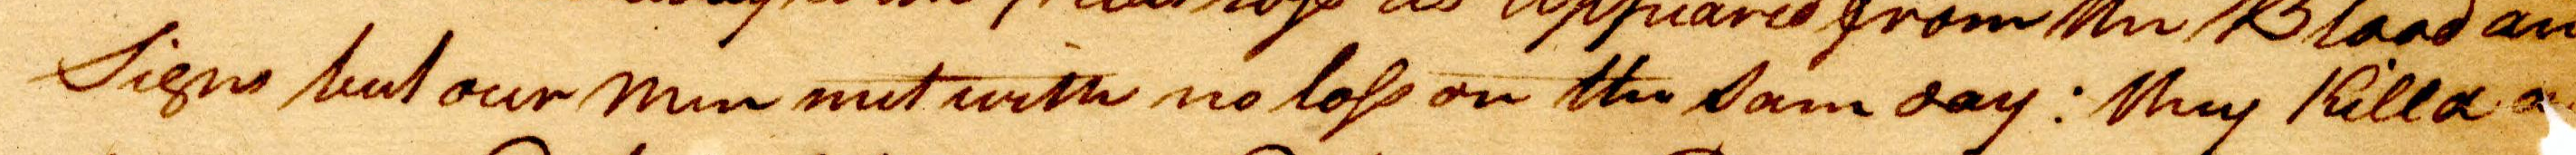Signs but our men met with no loss on the Same day: they kill'd a
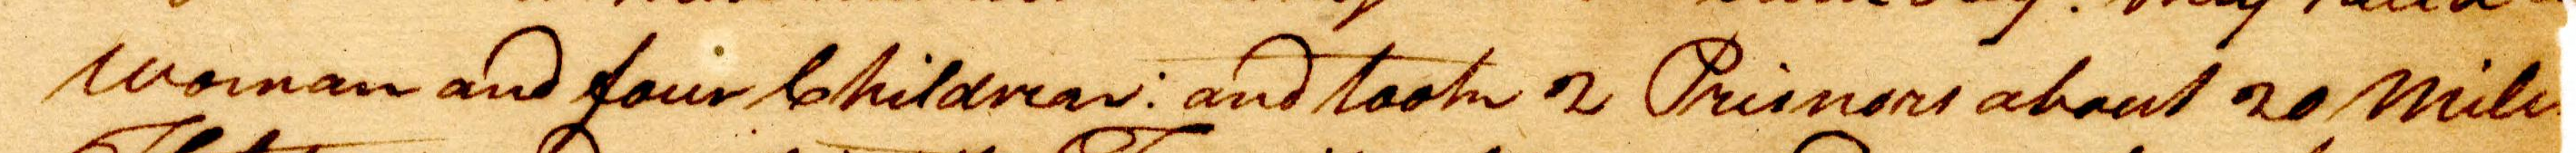woman and four Children: and took 2 Prisoners about 20 Mile
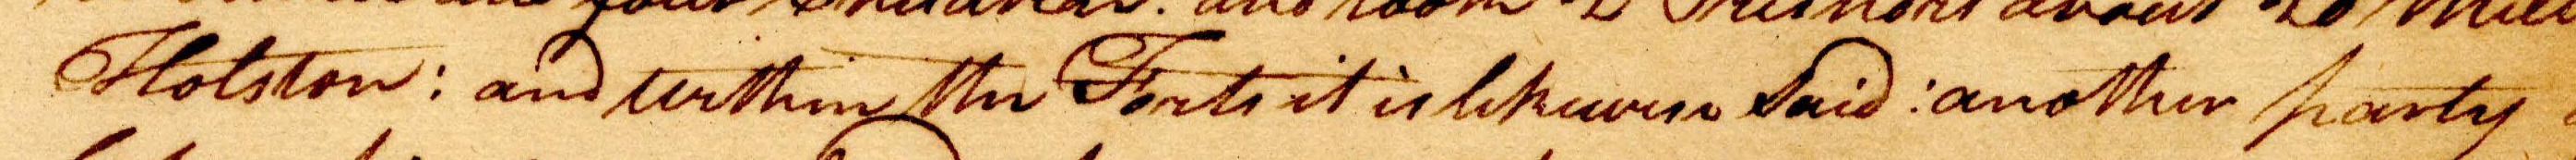Holston: and within the Forts it is likewise Said another party
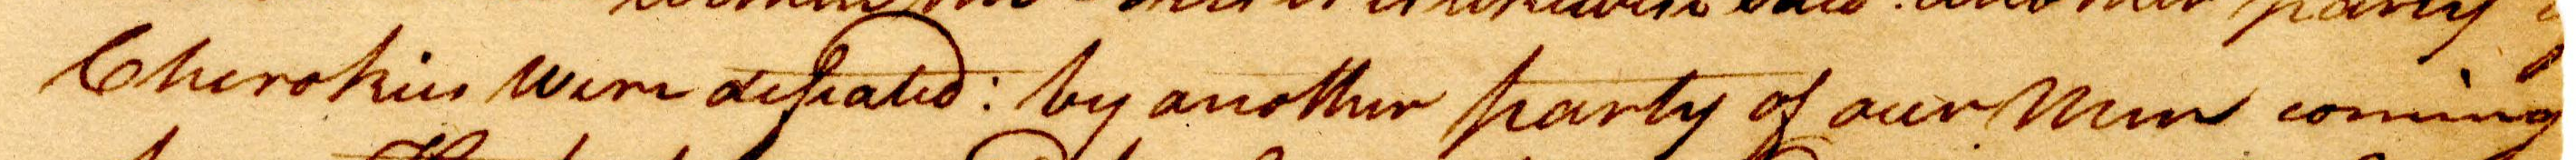Cherokies were defeated: by another party of our men coming
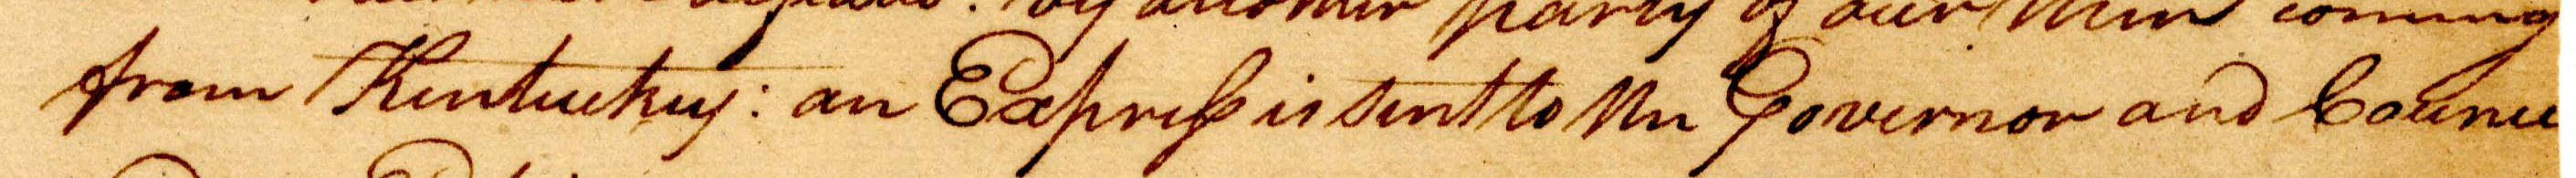from Kentuckey: an Express is sent to the Governor and Counce
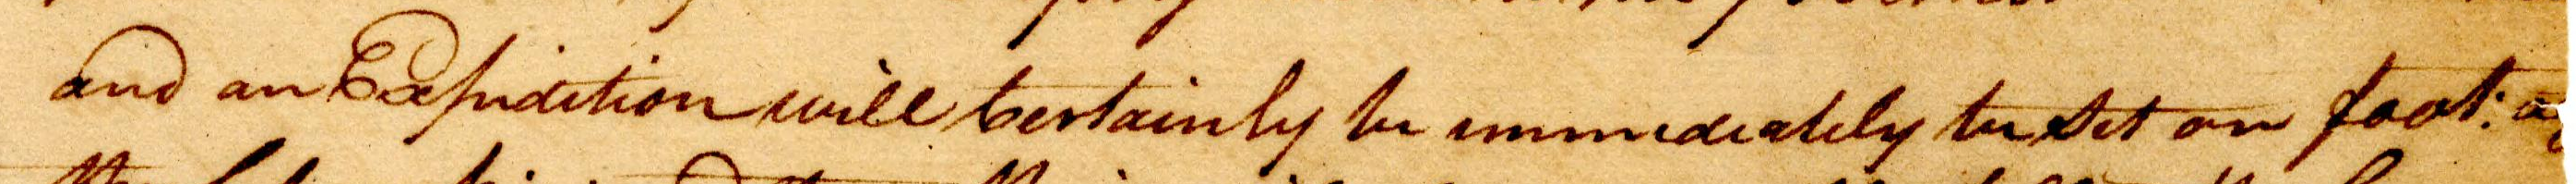and an Expedition will certainly be immediately to set on foot: a
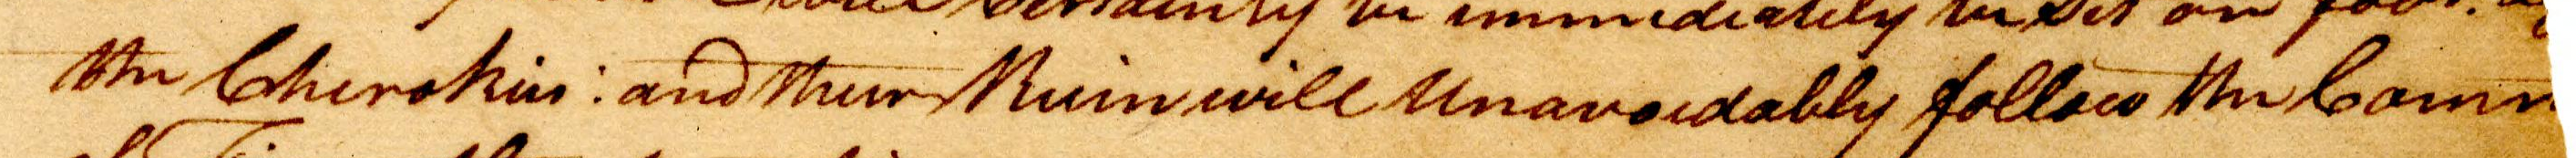the Cherokies: and their Ruin will Unavoidably follow the Coun
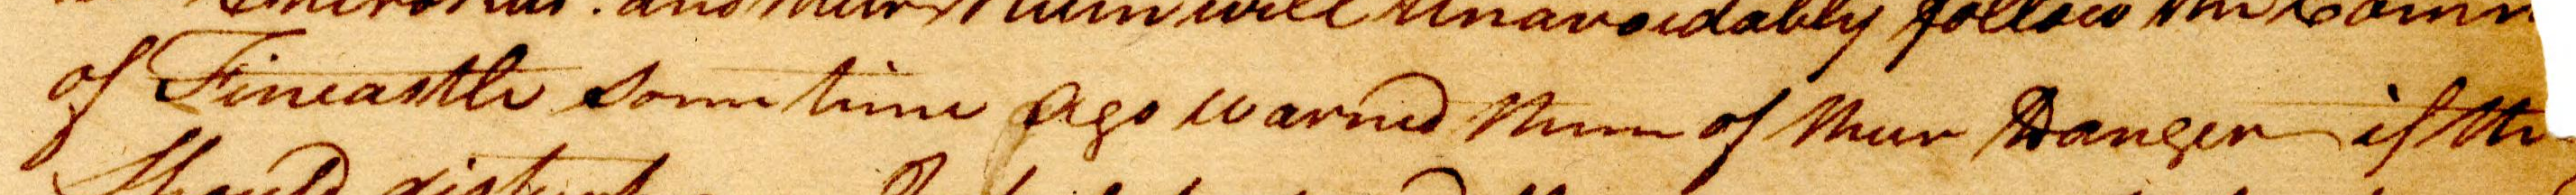of Fincastle sometime ago warned them of their Danger if th
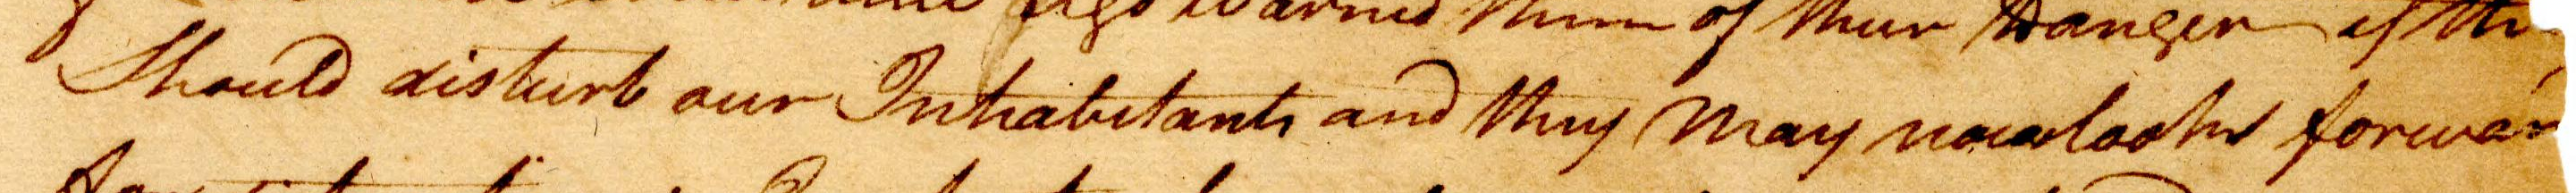should disturb our Inhabitants and they may now look forward
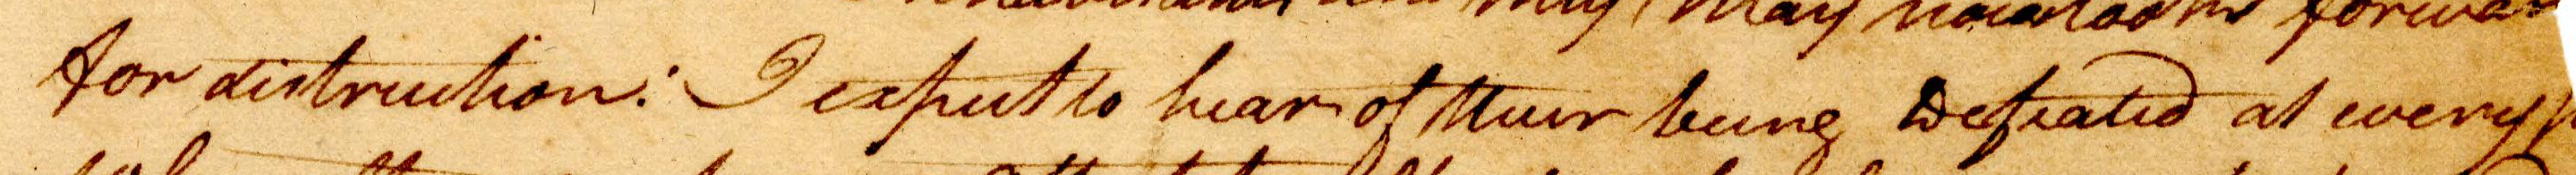for destruction. I expect to hear of their being Defeated at every
